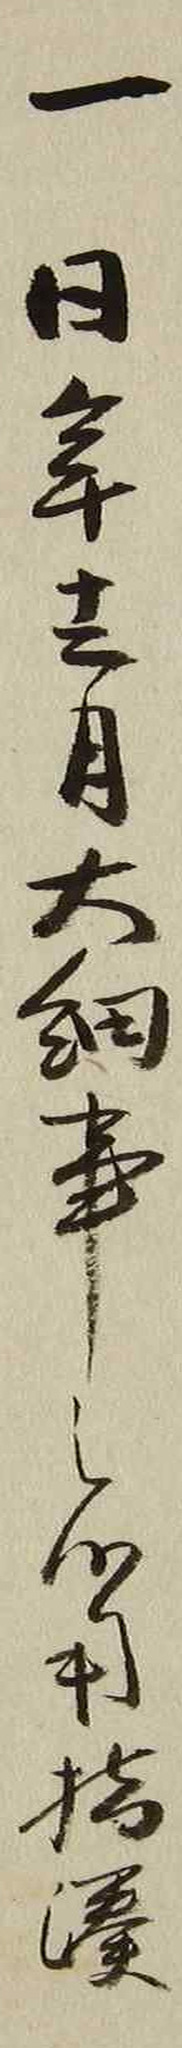一同年十二月大細事之御用指湊
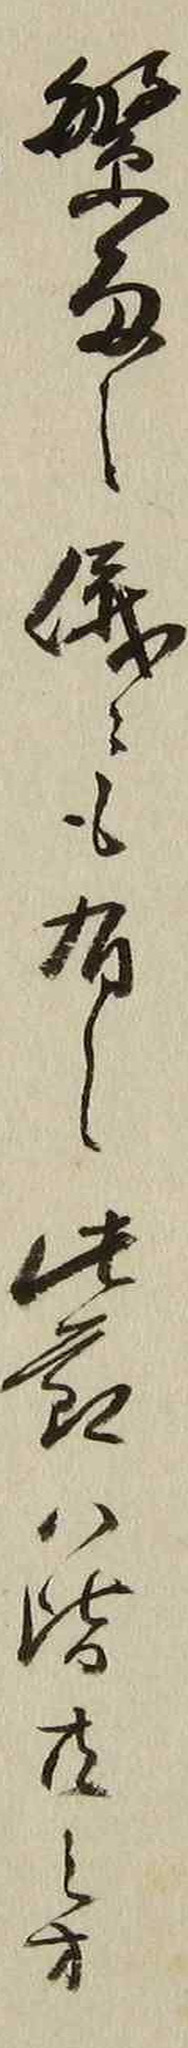繁多之儀にも有之此節は皆共之方
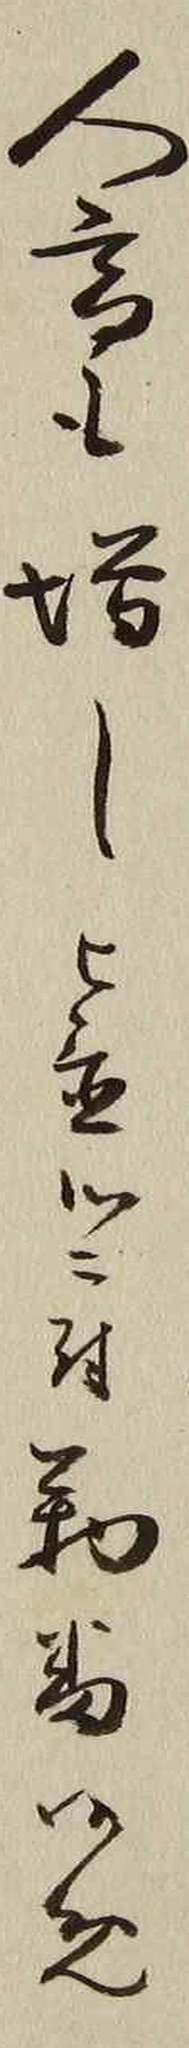人高も増之被置候に付勤番御免
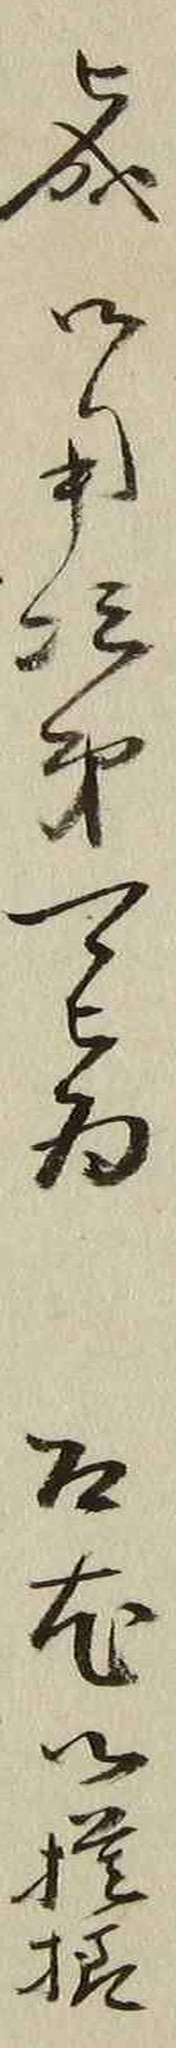被成御用次第可被為召尤御模様
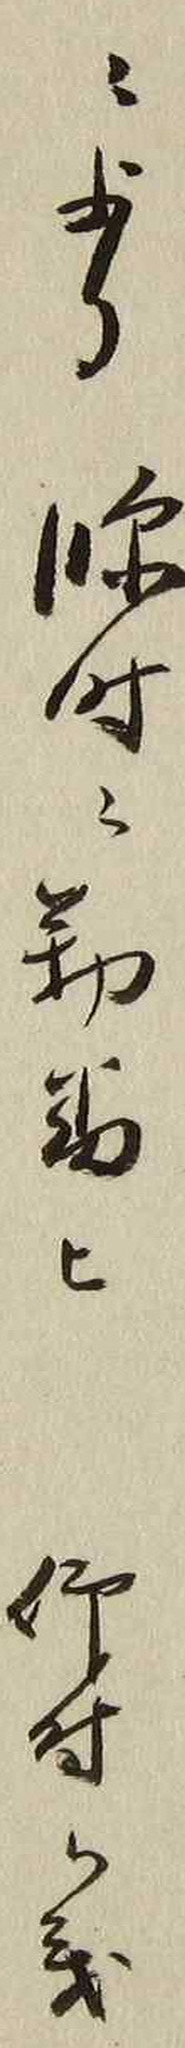により臨時之勤番被仰付候義
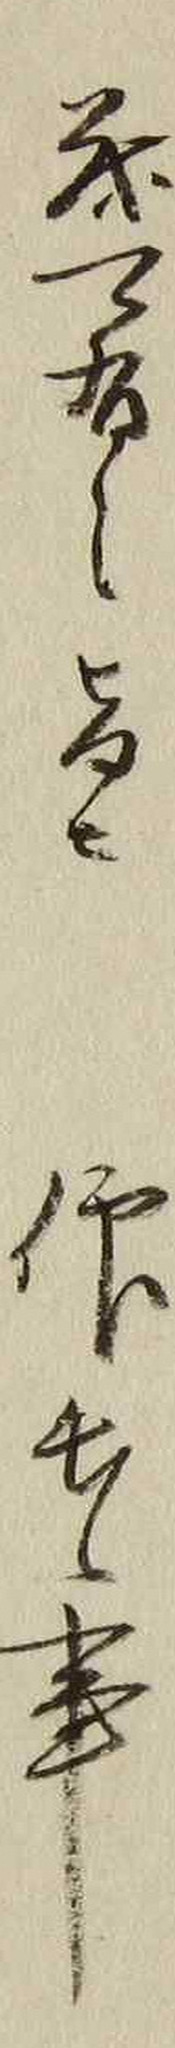も可有之旨被仰出候事
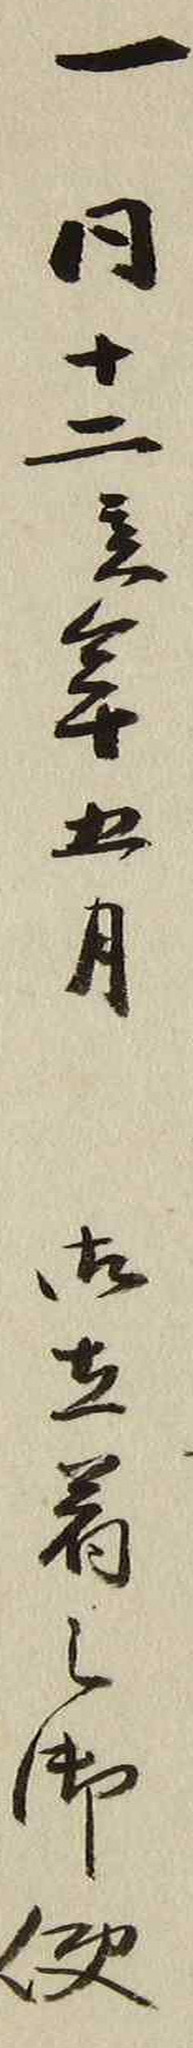一同十二亥年五月御立着之御使
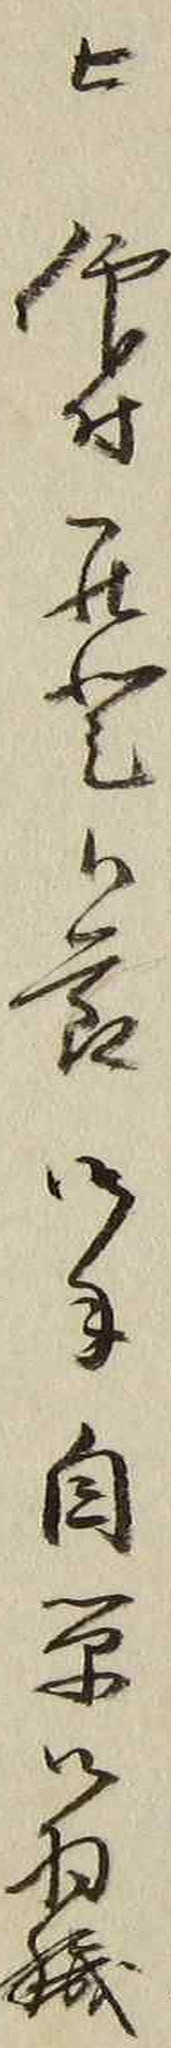被仰付罷登候節御手自単御羽織
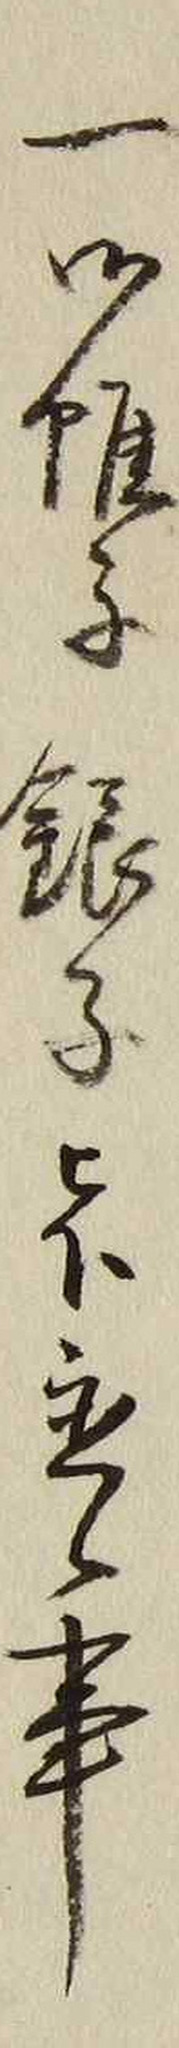一御帷子銀子被下置候事
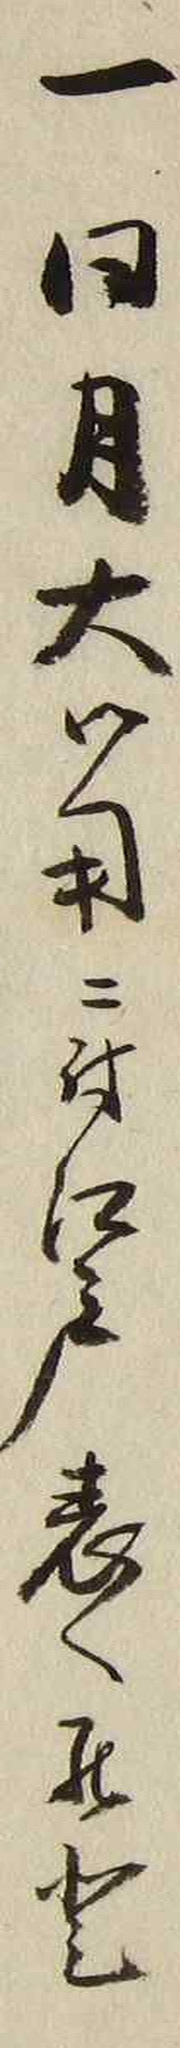一同月大御用に付江戸表へ罷登
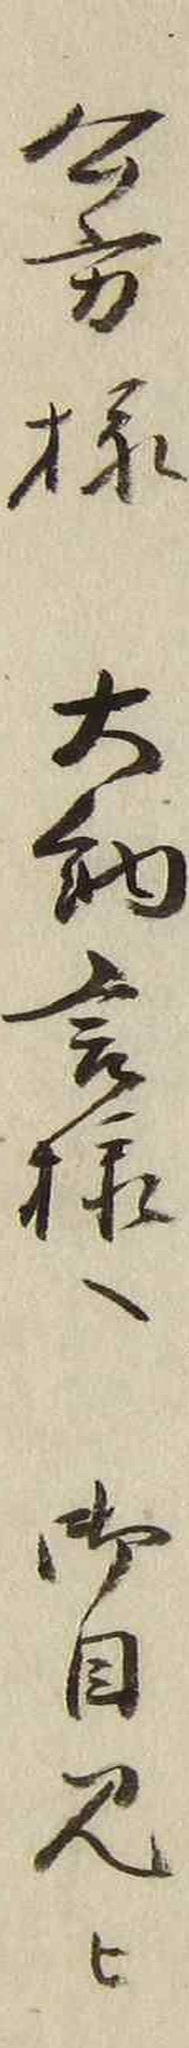公方様大納言様へ御目見被

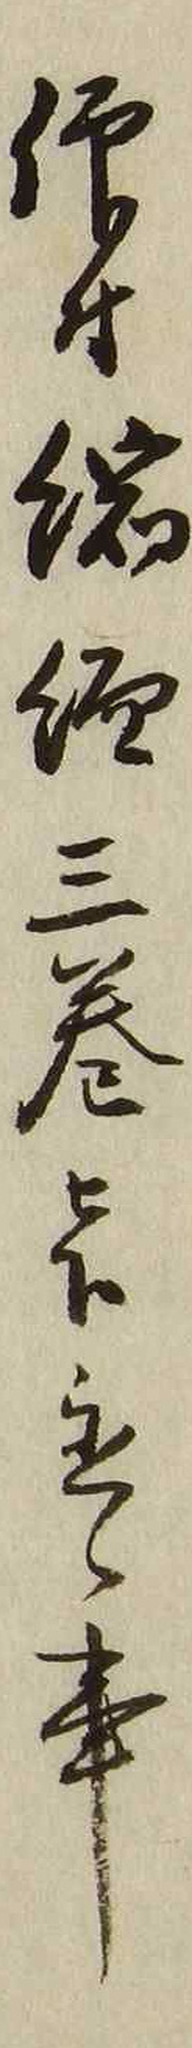仰付縮緬三巻被下置候事
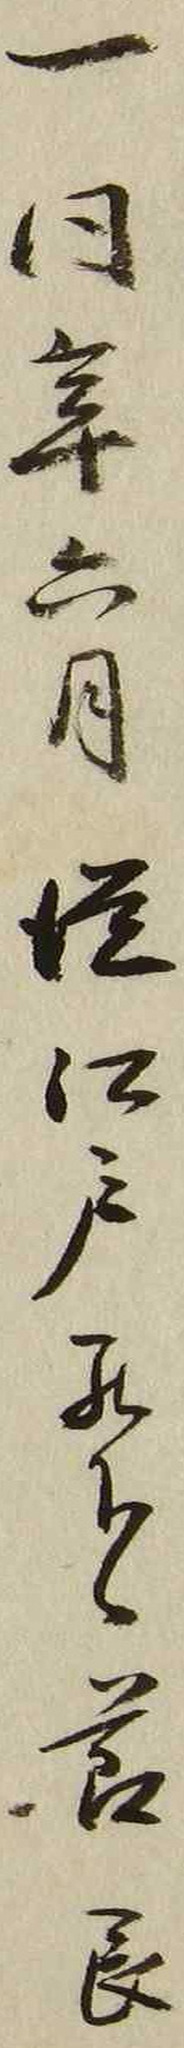一同年六月従江戸罷下候節良
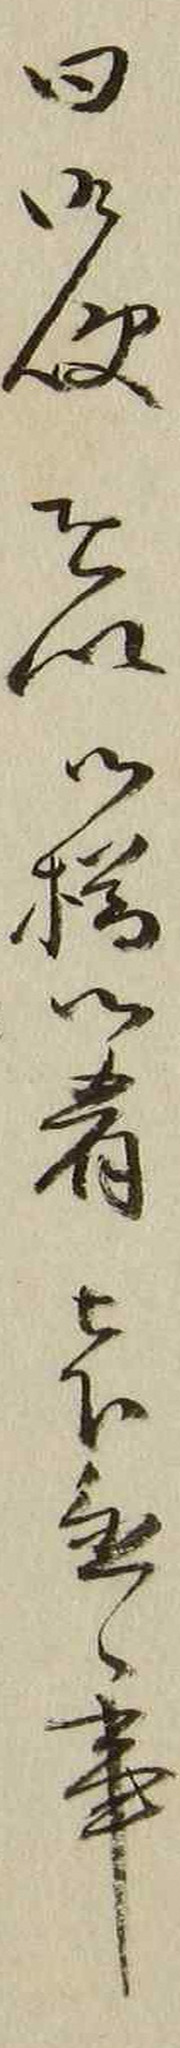日御使を以御樽御肴被下置候事
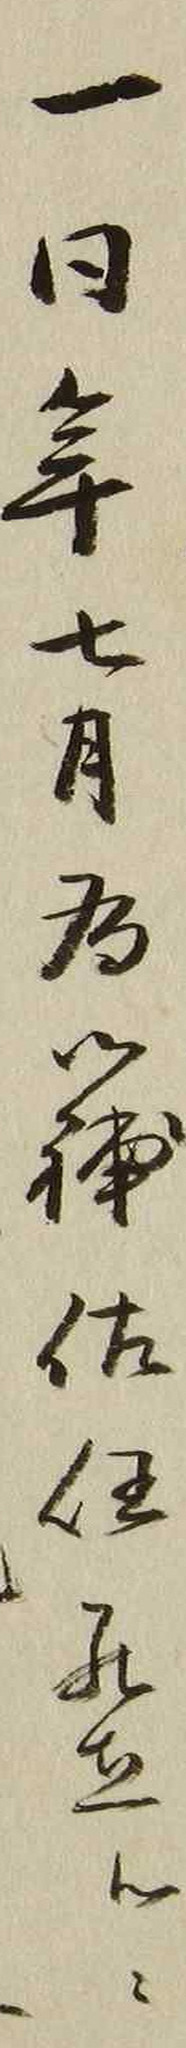一同年七月為御補佐任罷在候に
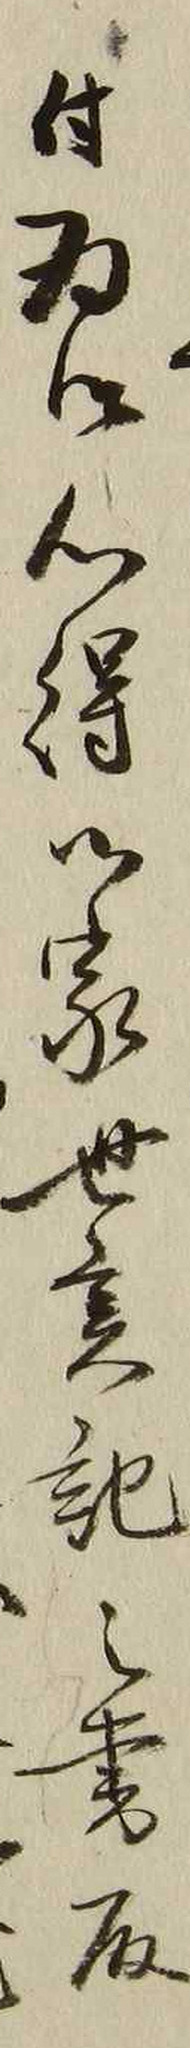付為御心得御家世実記之書取
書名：諸士系譜　巻之292　き之部1
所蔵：会津若松市立会津図書館
